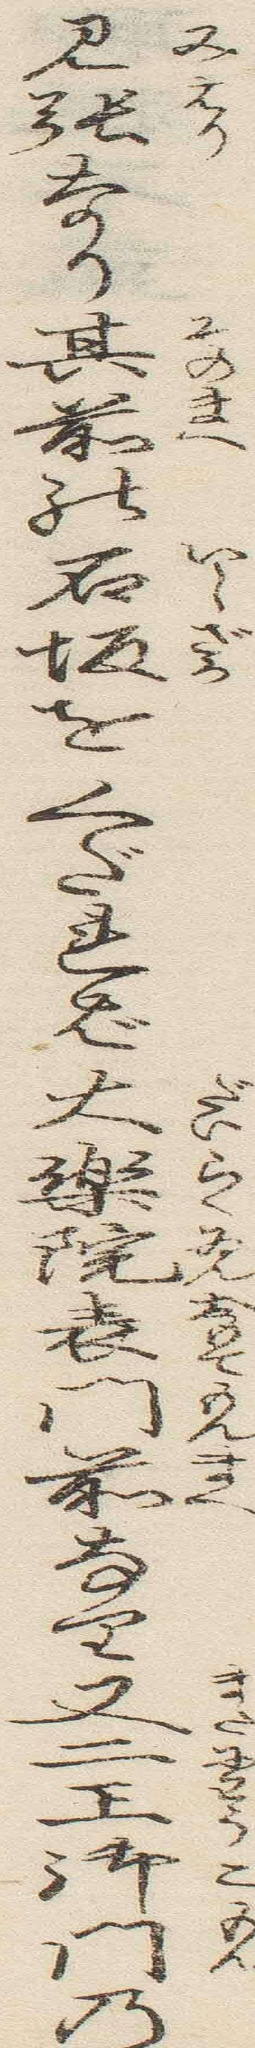見張なり其前の石坂をくだれば大樂院表門前なり又二王御門の
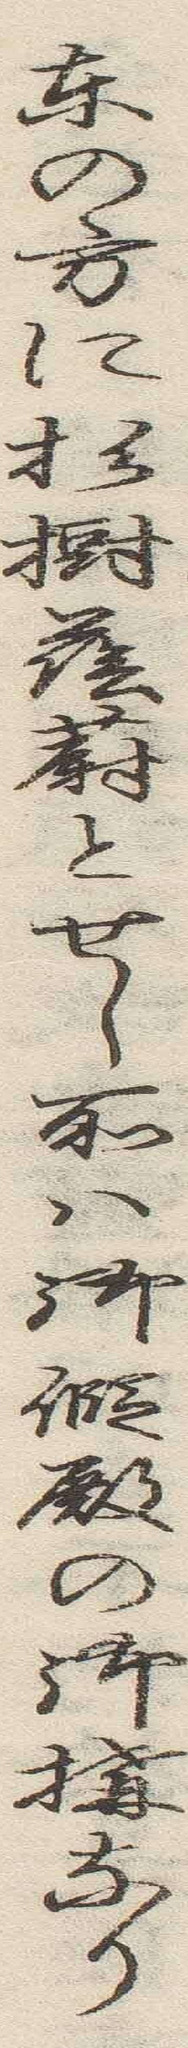東の方に杉𣗳蔭蔚とせし所は御假殿の御構なり
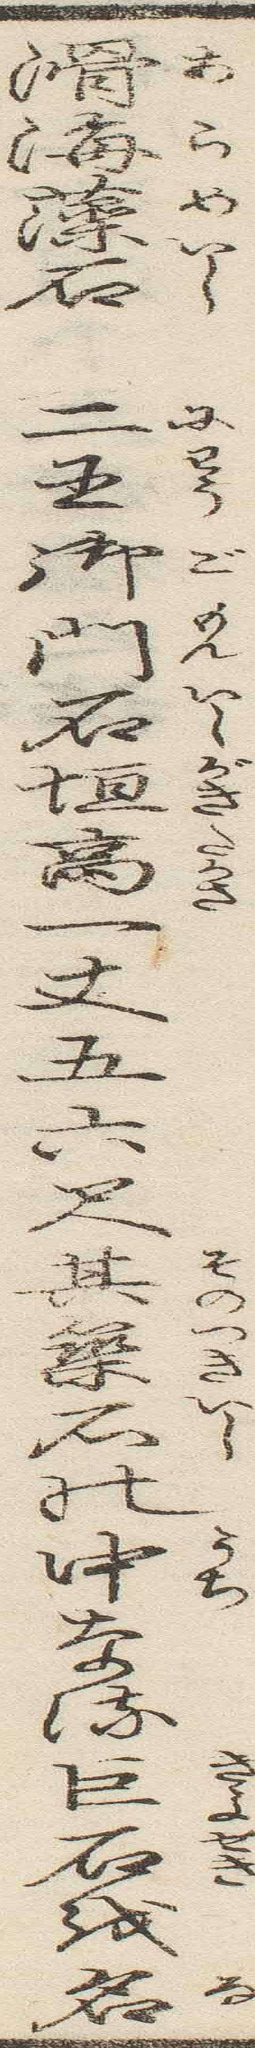滑海藻石二王御門石垣高一丈五六尺其築石の中なる巨石を名
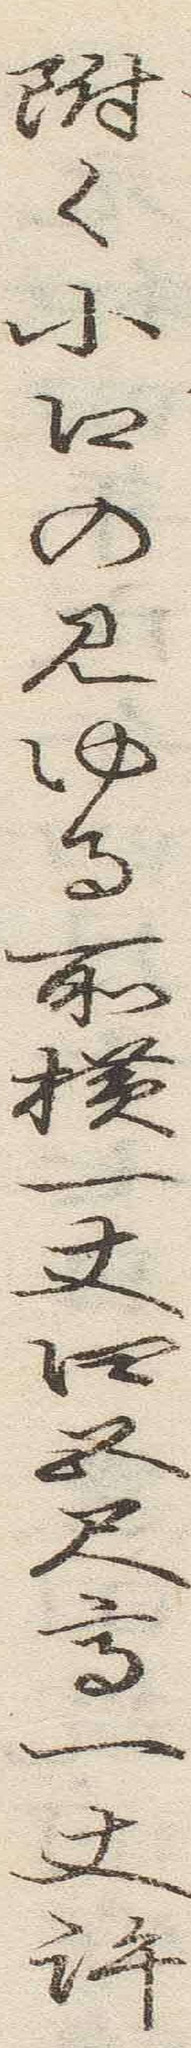附く小口の見ゆる所横一丈四五尺高一丈許
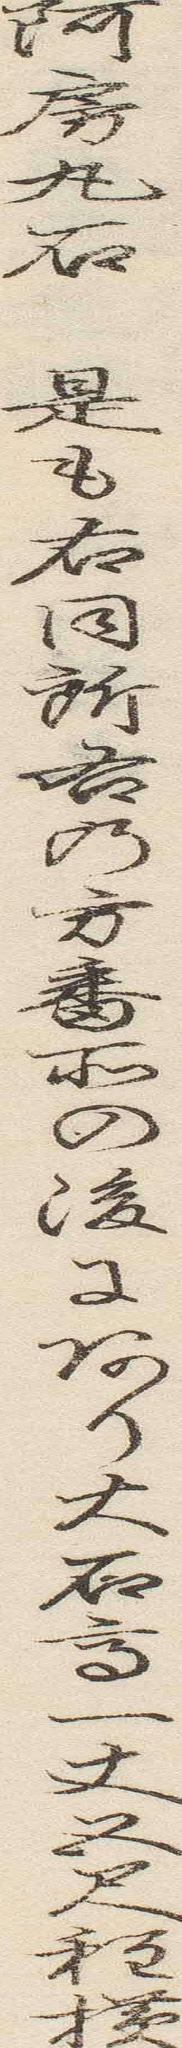阿房丸石是も右同所右の方番所の後にあり大石高一丈五尺程横
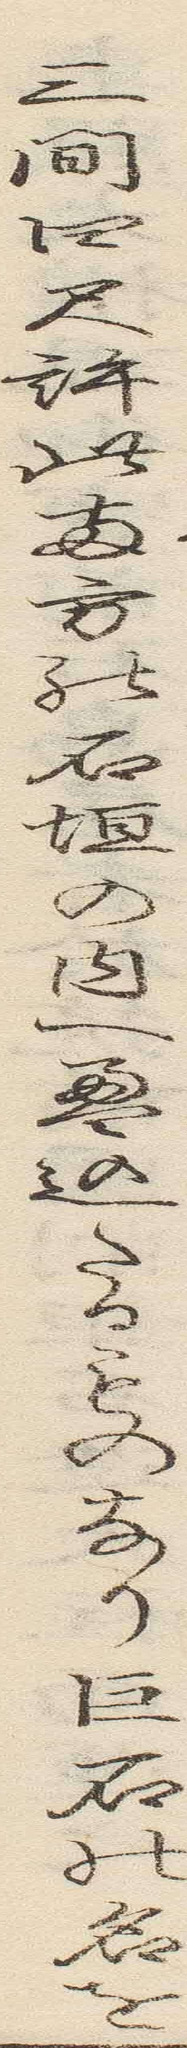三間四尺許此両方の石垣の内へ畳込たるものなり巨石の名を
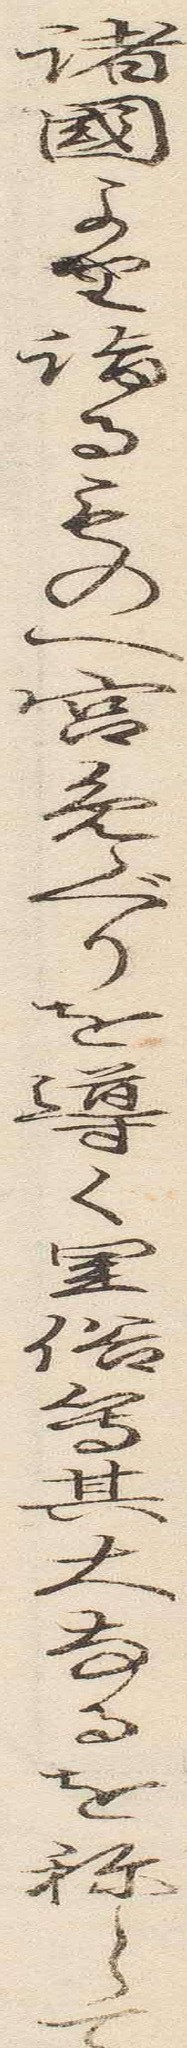諸國より詣るものへ宮めぐりを導く里俗等其大なるを称して
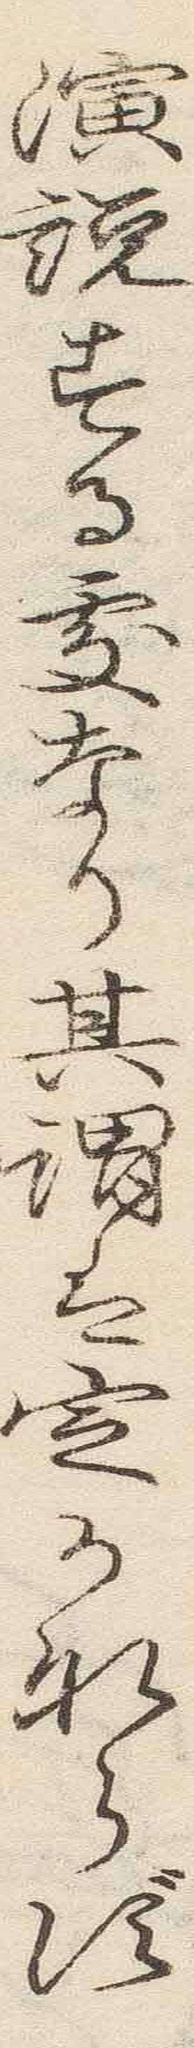演説する處なり其謂は定かならず
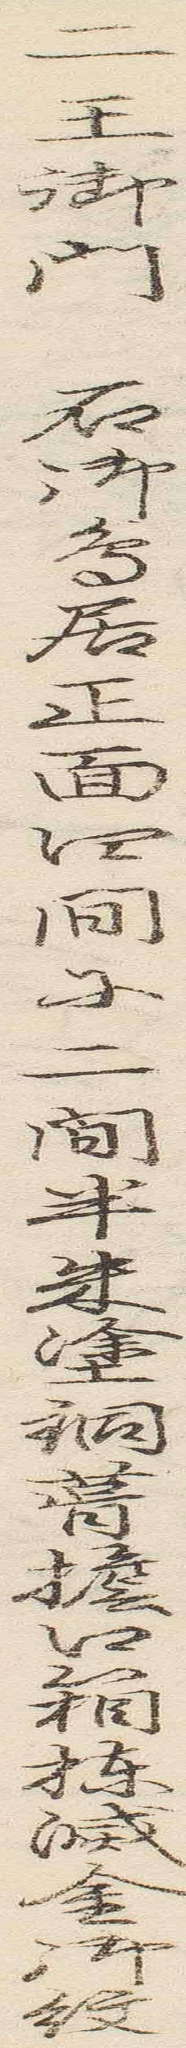二王御門石御鳥居正面四間に二間半朱塗銅葺檐口箱棟滅金御紋
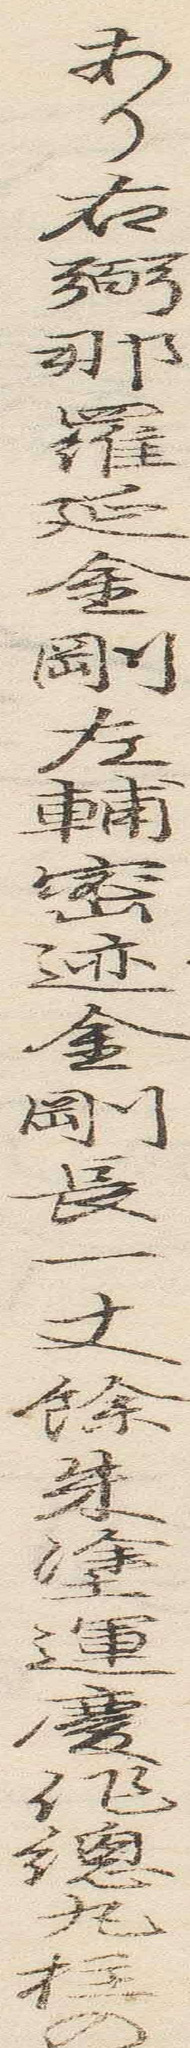あり右弼那羅延金剛左輔密迹金剛長一丈餘朱塗運慶作總丸柱の
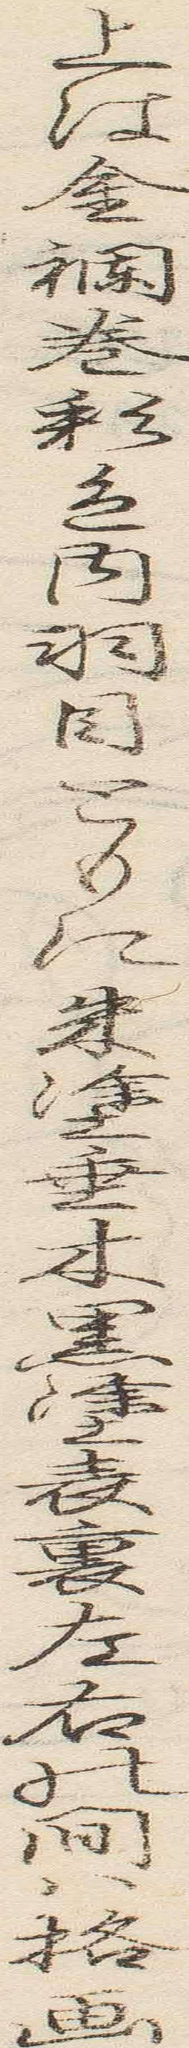上は金襴巻彩色内羽目ともに朱塗垂木黒塗表裏左右の間は格画
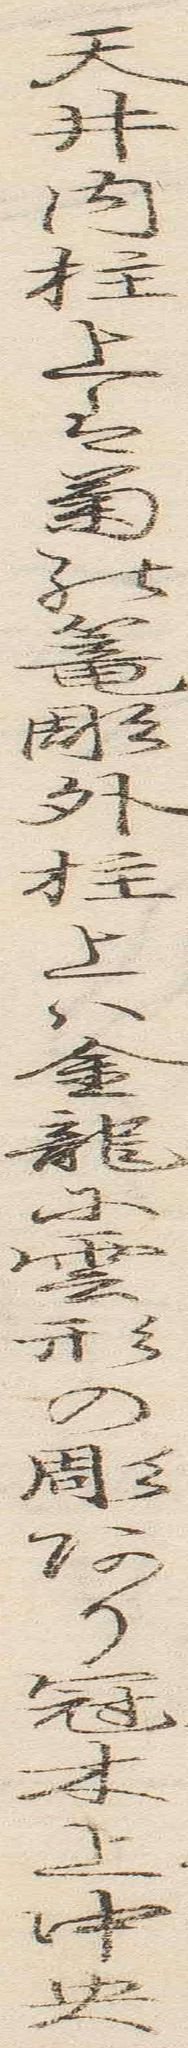天井内柱上は菊の篭彫外柱上は金龍に雲形の彫あり冠木上中央
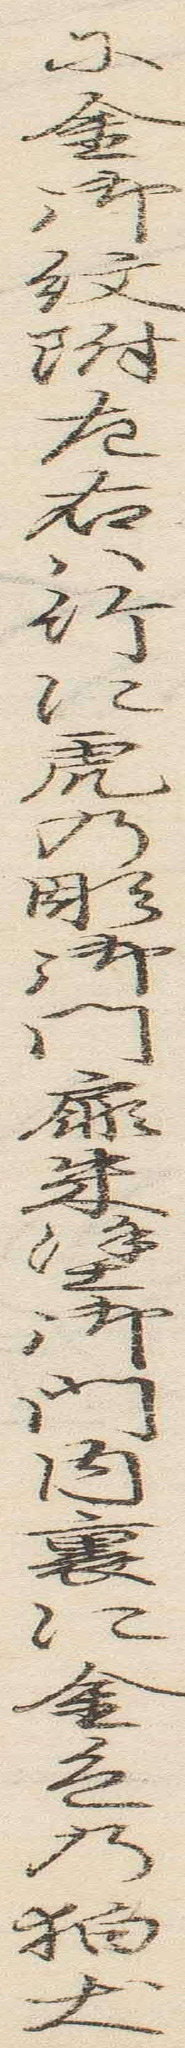に金御紋附左右は竹に虎の彫御門扉朱塗御門内裏に金色の狛犬
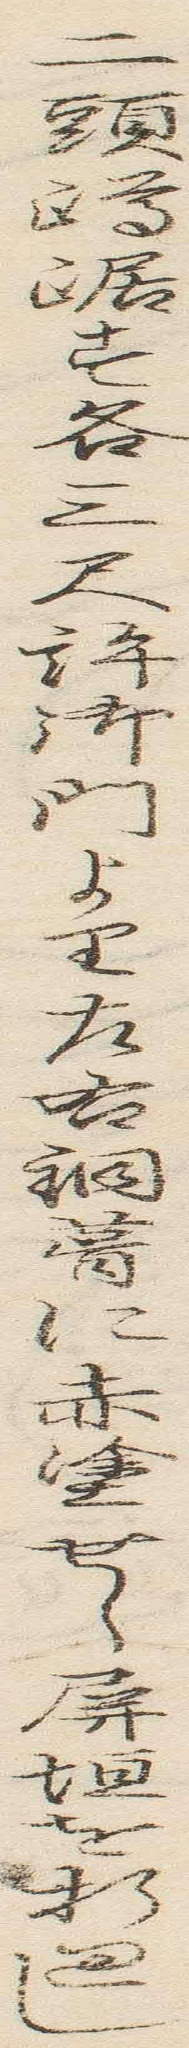二頭蹲踞す各三尺許御門より左右銅葺に赤塗せし屏垣を折廻し
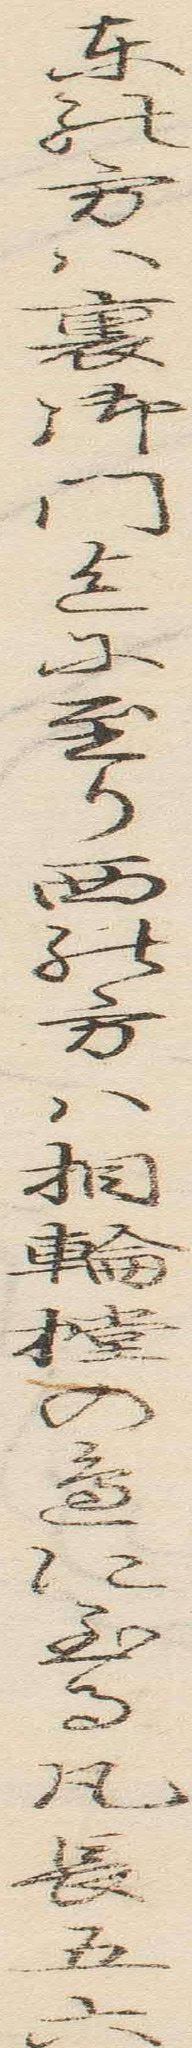東の方は裏御門迄に至り西の方は相輪樘の邊に至る凡長五六
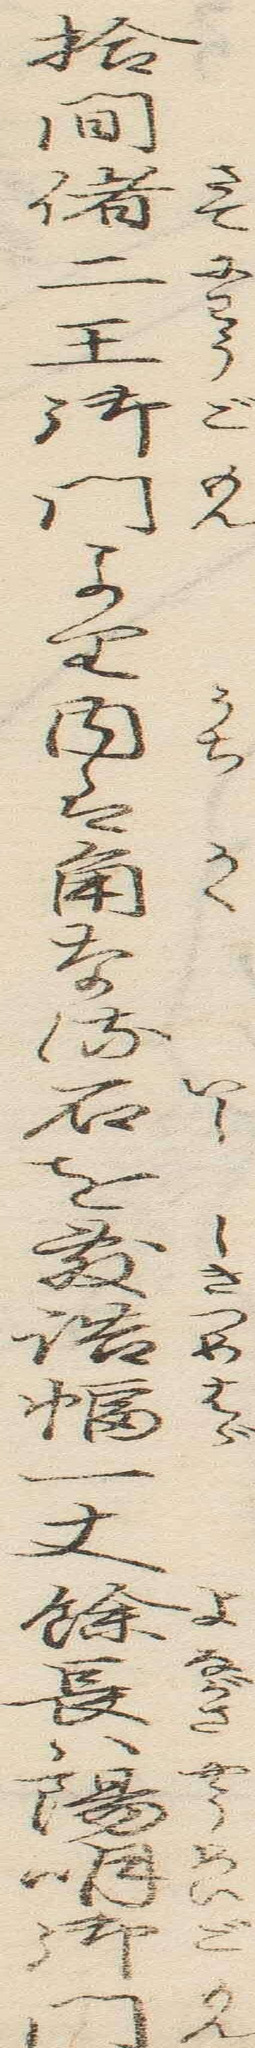拾間偖二王御門より内は角なる石を敷詰幅一丈餘長は陽明御門
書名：日光山志
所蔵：東京学芸大学附属図書館 国文学研究資料館
